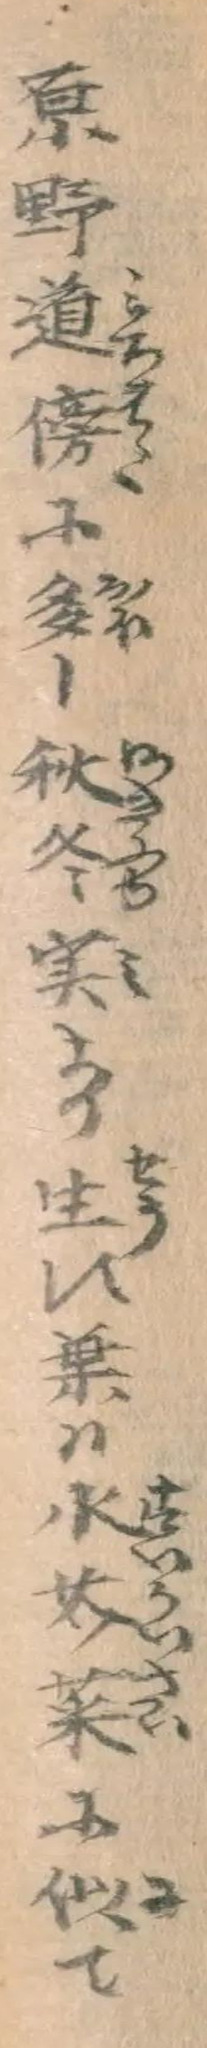原野道傍に多し秋冬実より生す葉は水芥菜に似て
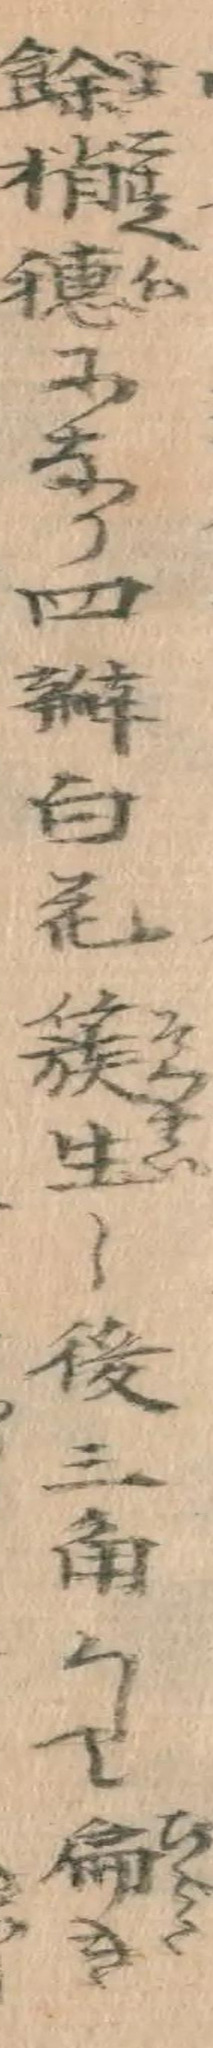余梢穂になり四弁白花簇生し後三角くして扁き
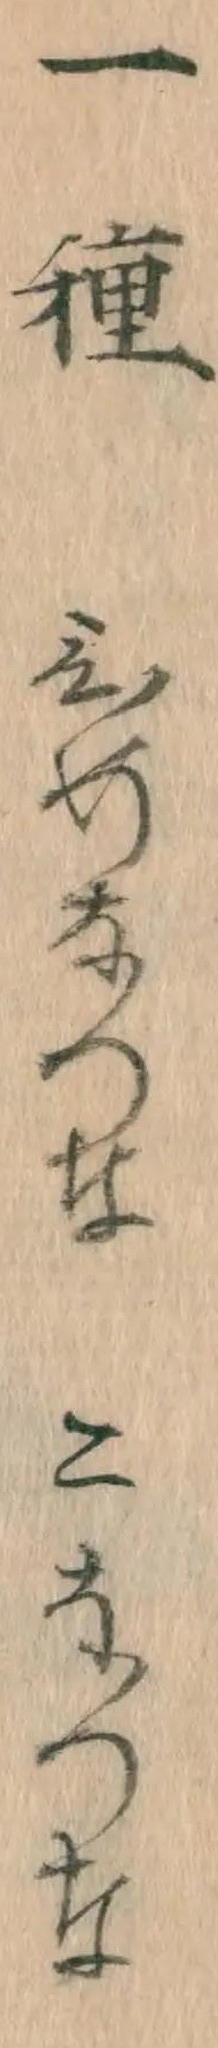一種ひめなつなこなつな
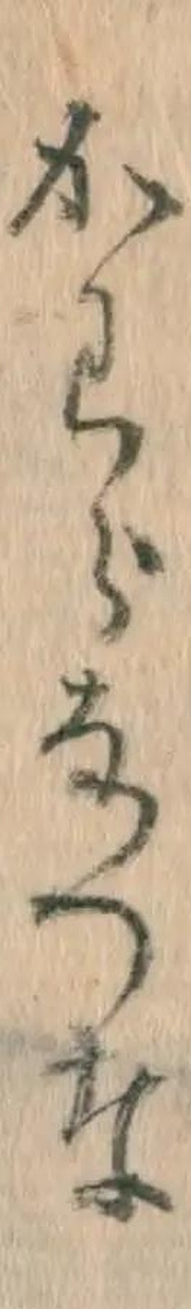かわらなつな
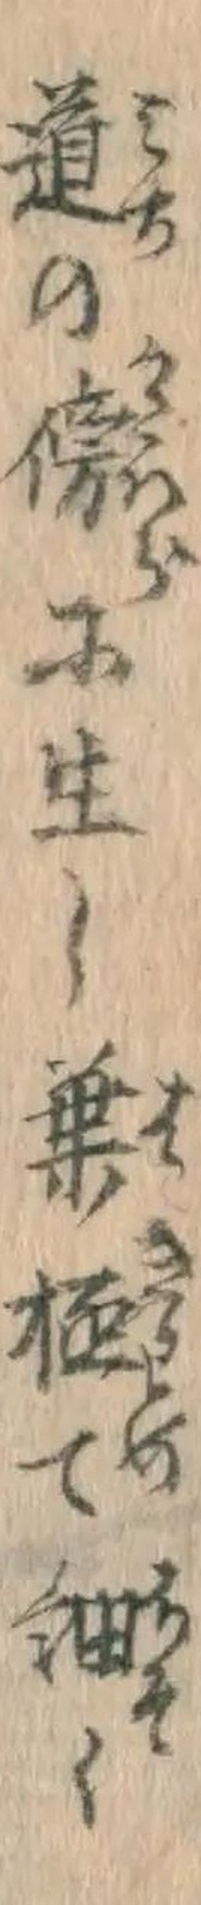道の傍に生し葉極て細く
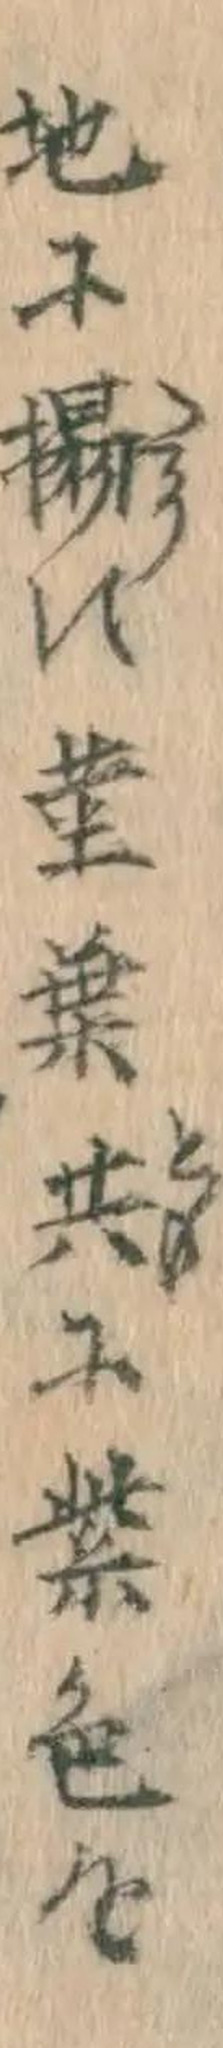地に搨す茎葉共に紫色を
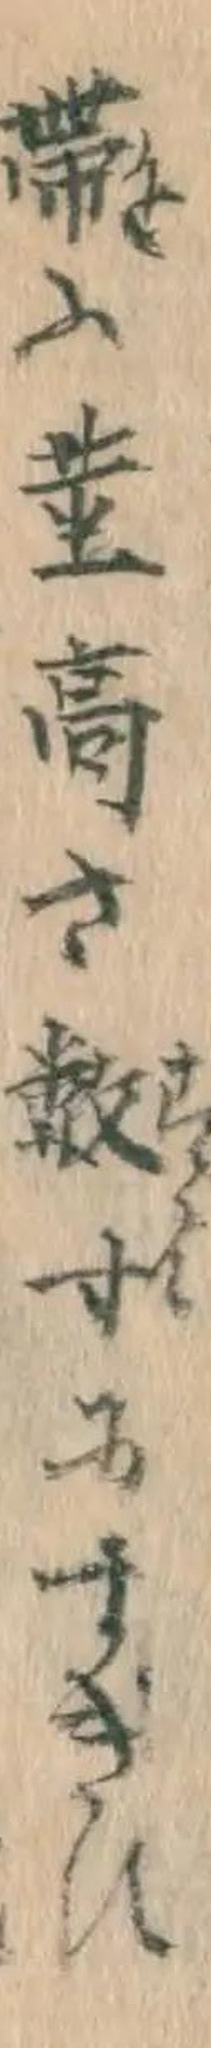帯ふ茎高さ数寸にすきす
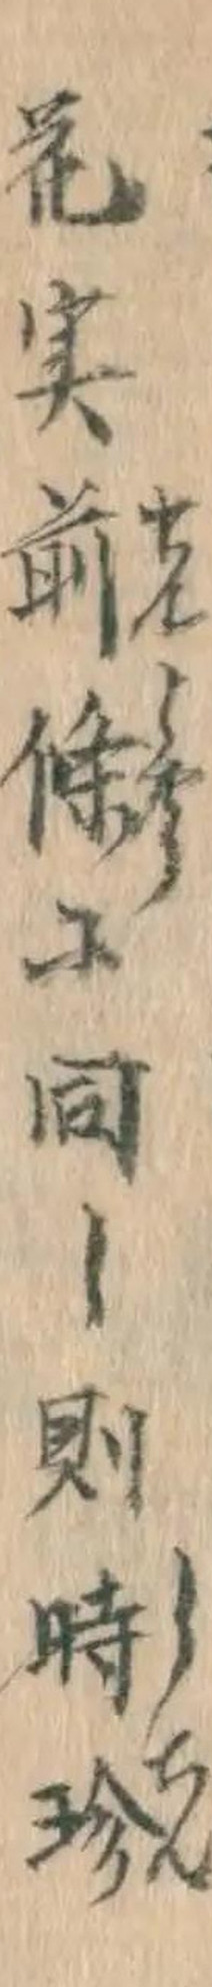花実前条に同し則時珍

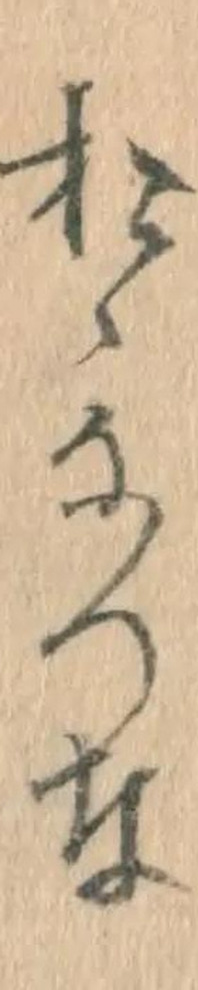おゝなつな
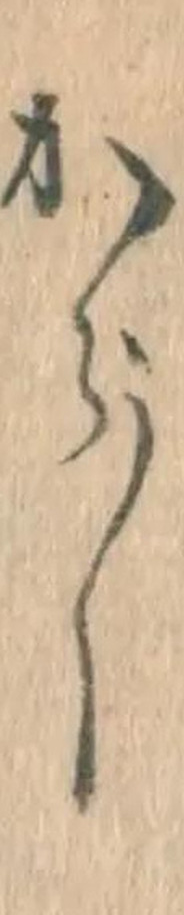から〳〵
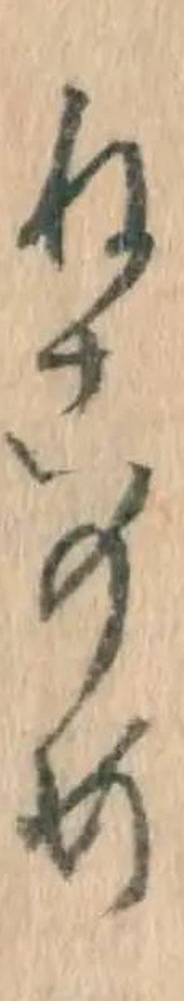ねこのめ
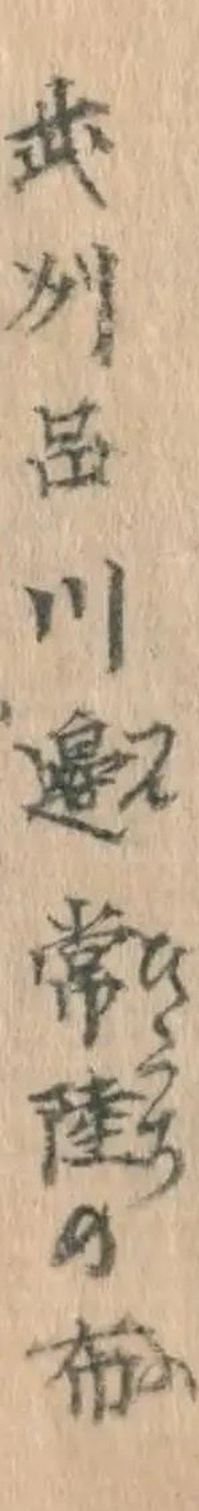武州品川辺常陸の布
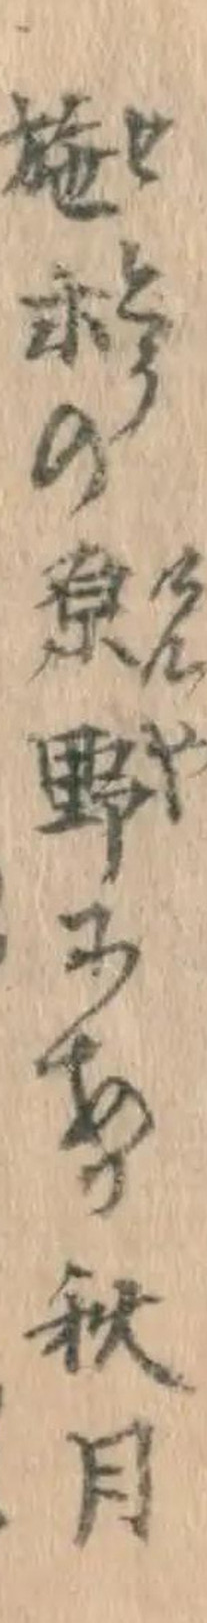施等の原野にあり秋月
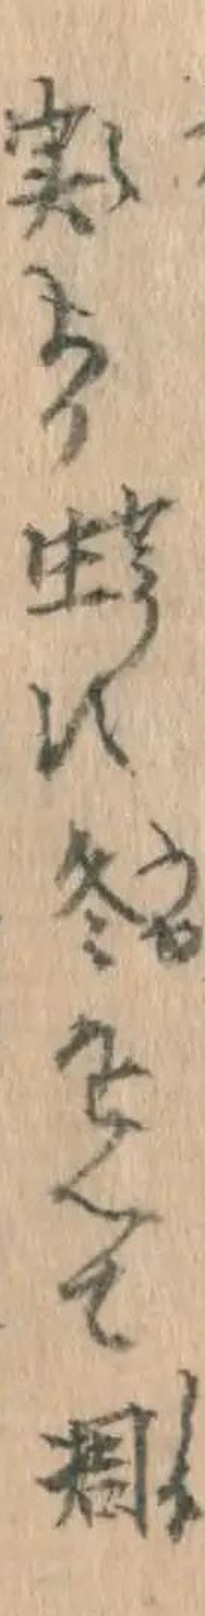実より生す冬をへて凋
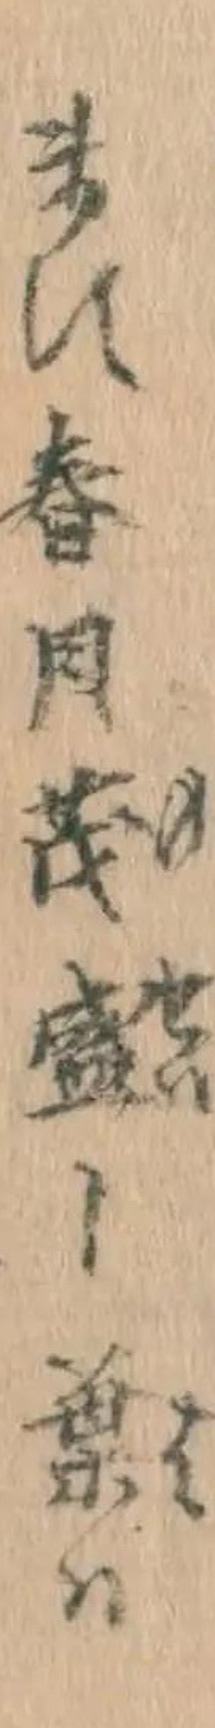ます春月茂盛し葉は
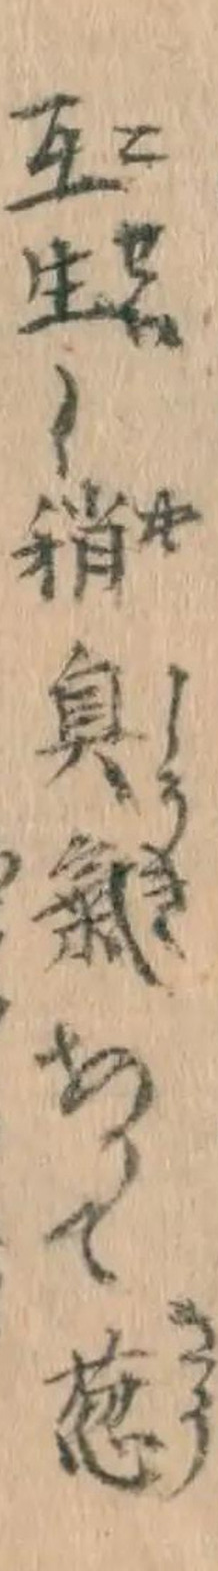互生し稍臭気ありて葱
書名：本草図譜. 巻46-48
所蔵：国立国会図書館 National Diet Library, JAPAN
